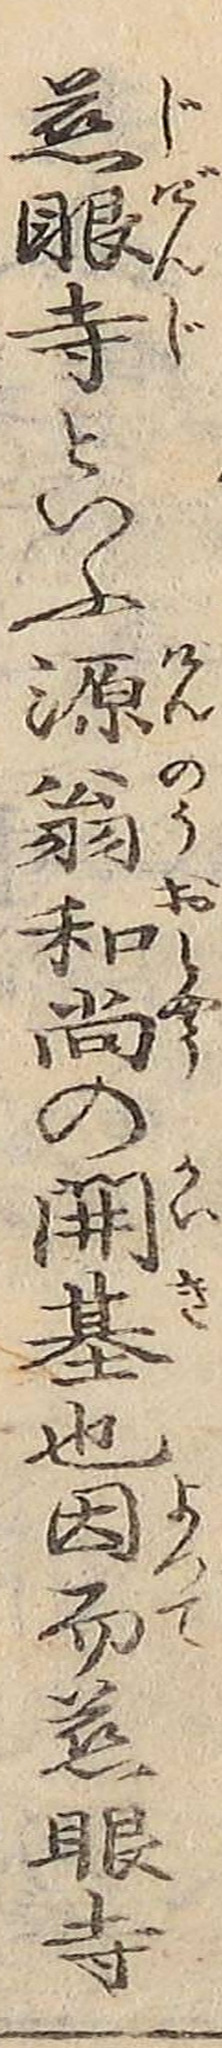慈眼寺といふ源翁和尚の開基也因而慈眼寺
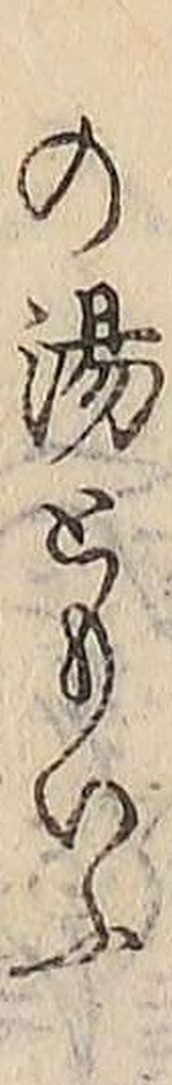の湯ともいふ
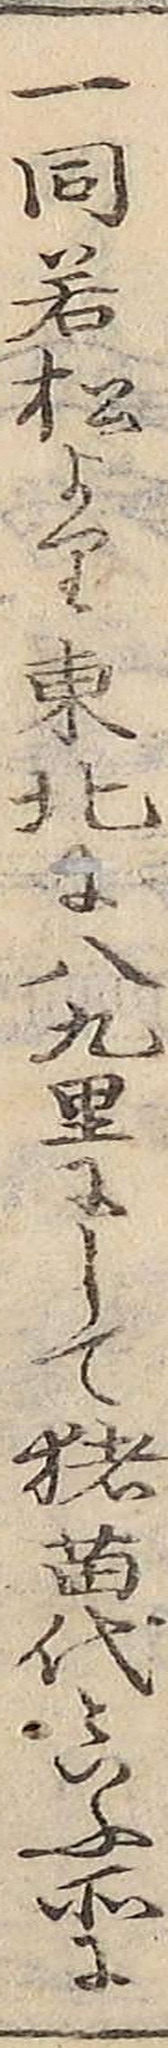一同若松より東北に八九里にして猪苗代といふ所に
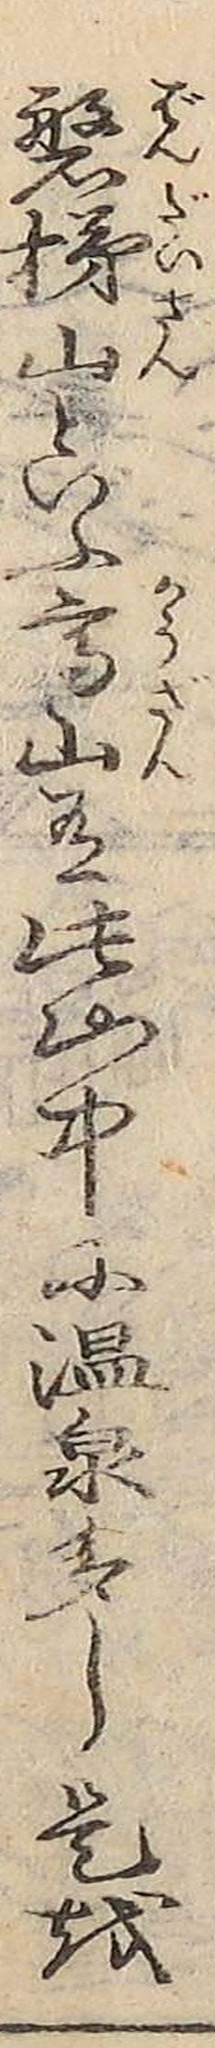磐梯山といふ高山有比山中に温泉多し是を
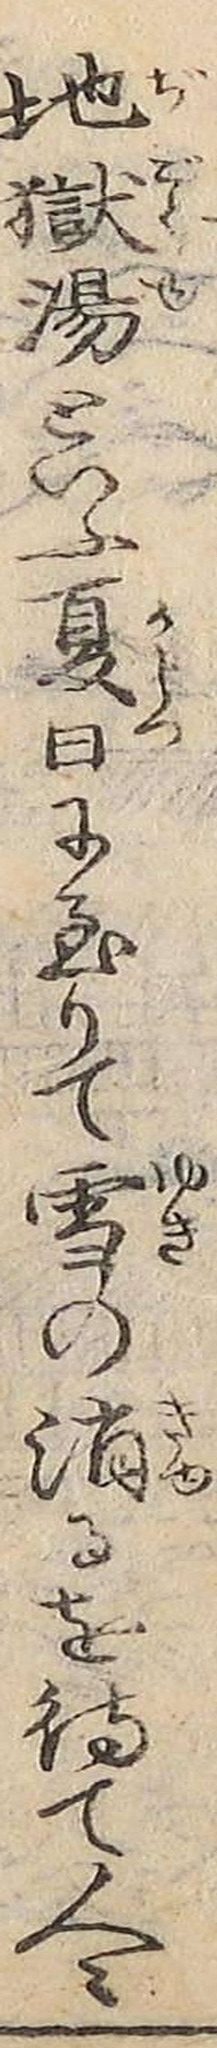地獄湯といふ夏日に至りて雪の消るを待て人々
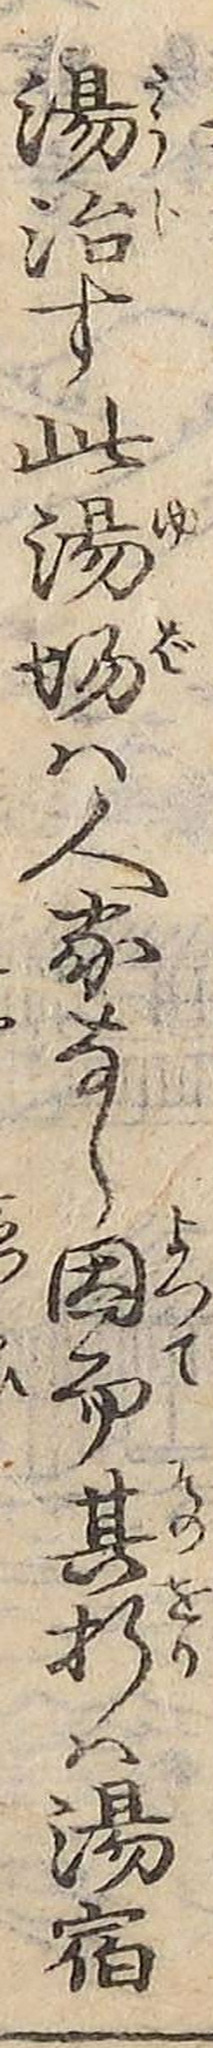湯治す此湯場は人家なし因而其折は湯宿
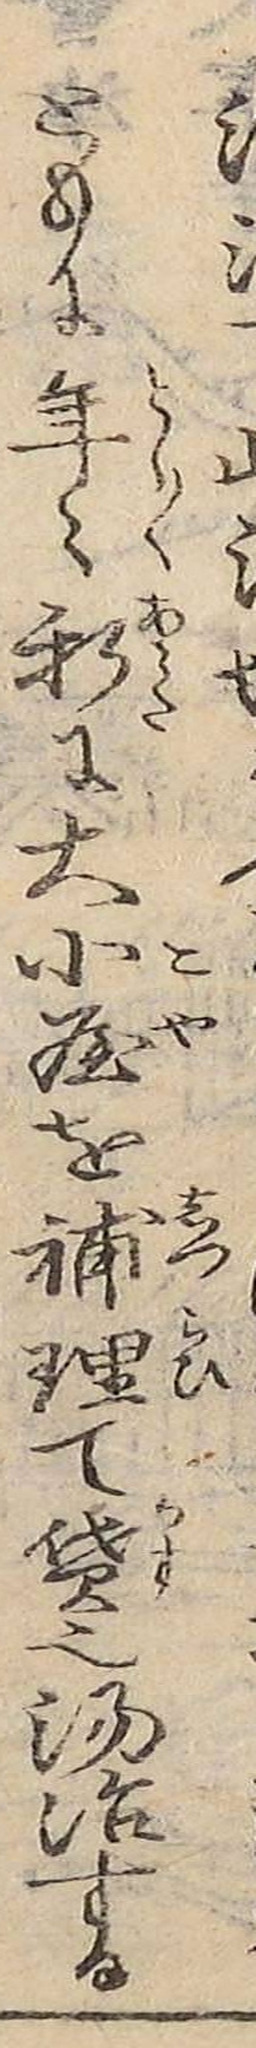ともに年々新に大小屋を補理て貸也湯治する

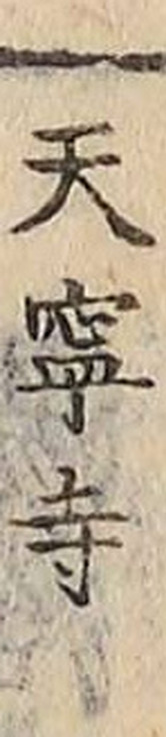天寧寺
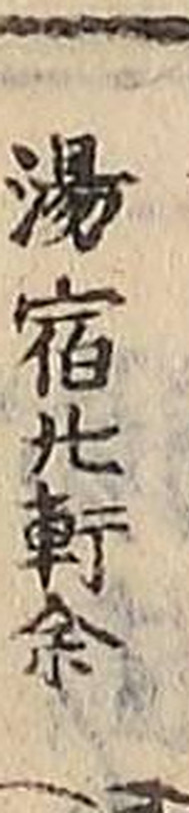湯宿廿軒余
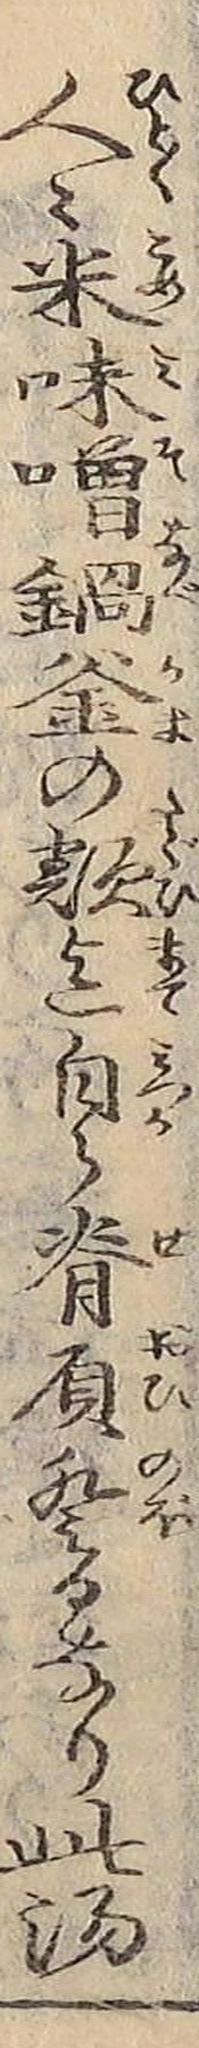人々米味噌鍋釜の類迄自ら背負登るなり此湯
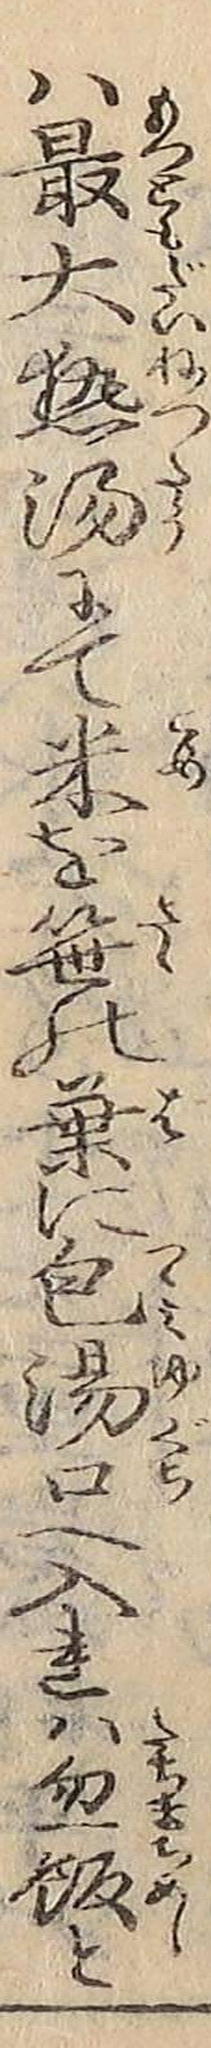は最大熱湯にて米を笹の葉に包湯口へ入れは忽飯と
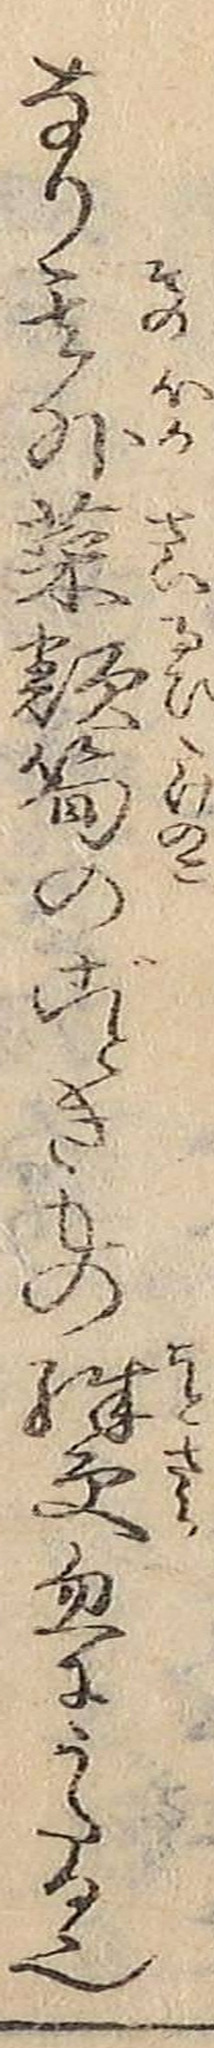なり其外菜類筍のごときもの殊更忽にうたる也
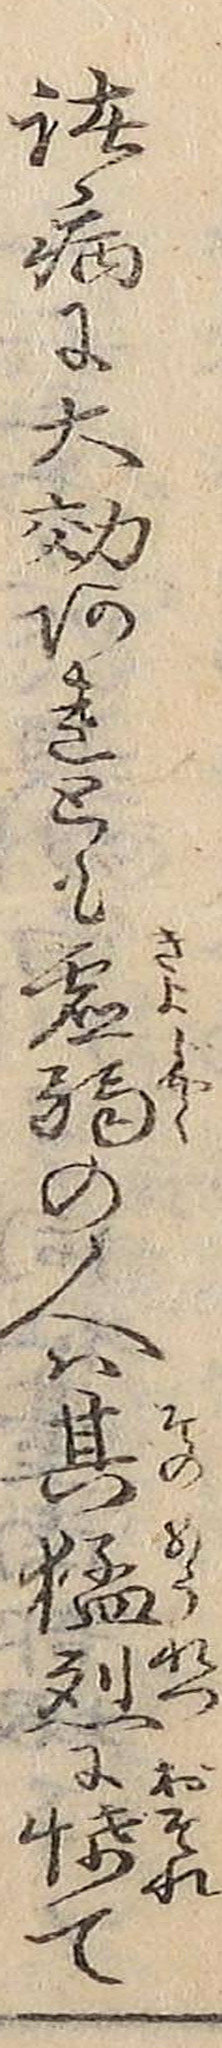諸病に大効あれとも虚弱の人は其猛烈に怖て
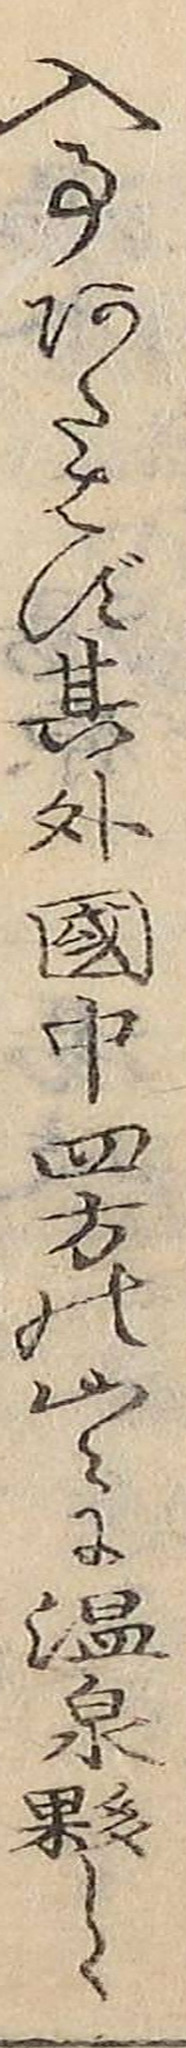入事あたはず其外国中四方の山々に温泉夥しく
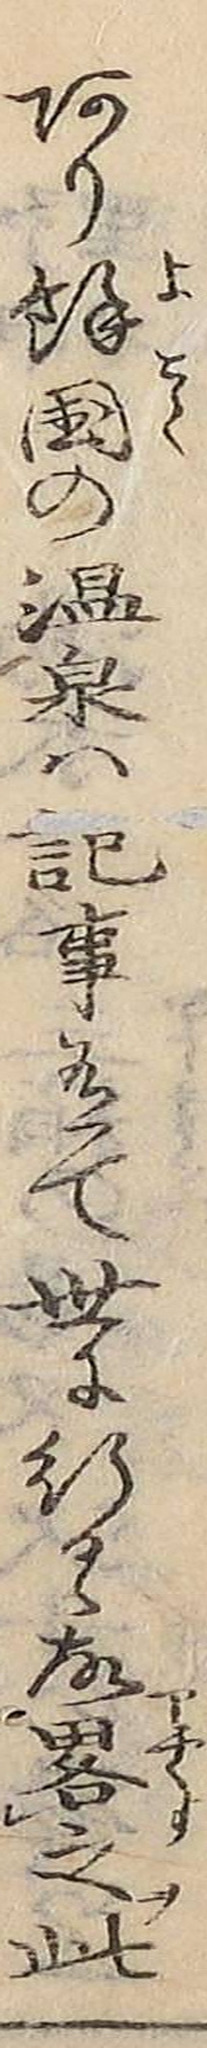あり余国の温泉は記事有て世に行るゝ故略之此
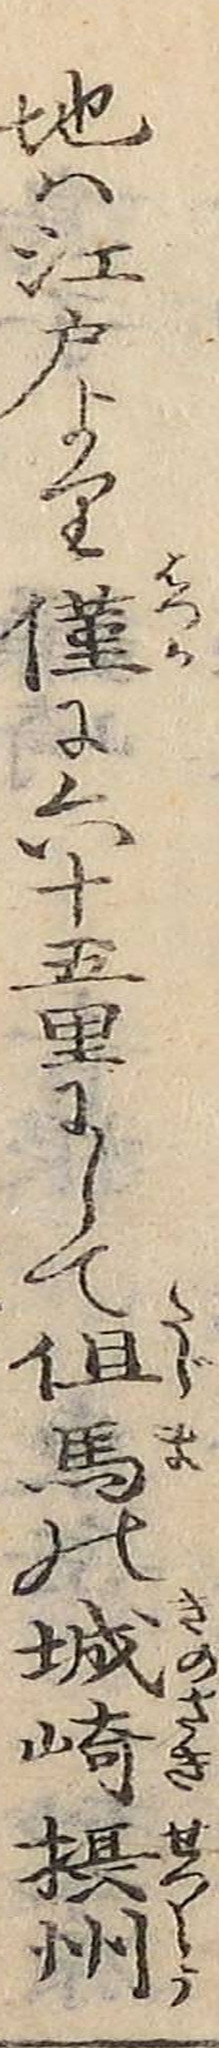地は江戸より僅に六十五里にして但馬の城崎摂州
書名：旅行用心集
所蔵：神戸大学附属図書館 国文学研究資料館
